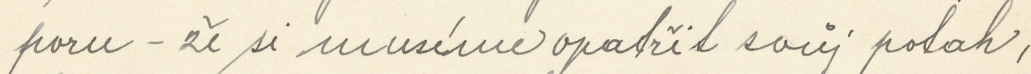poru - že si musíme opatřit svůj potah,
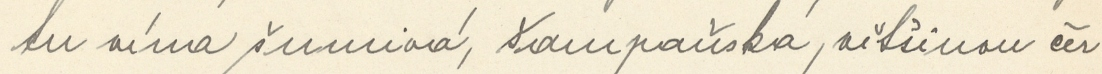tu vína šumivá, šampaňská, většinou čer-
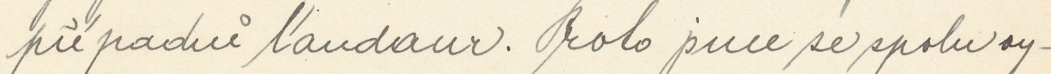případně landaur. Proto jsme se spolu vy-
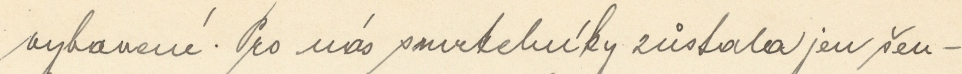vybavené. Pro nás smrtelníky zůstala jen šen-
